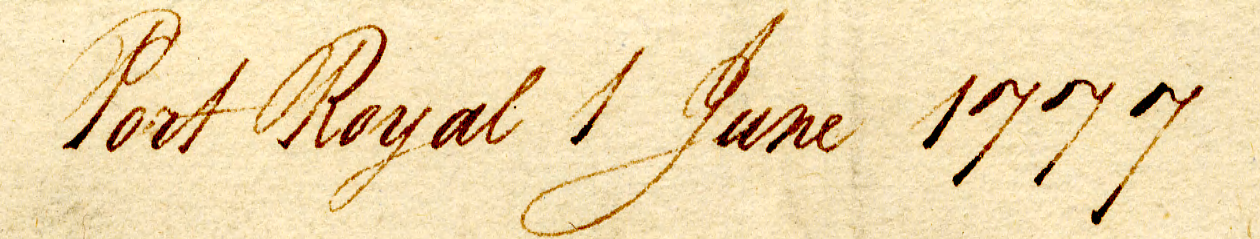Port Royal 1 June 1777
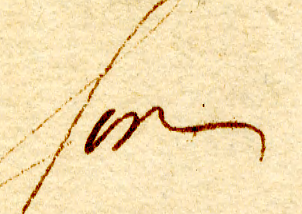Sir
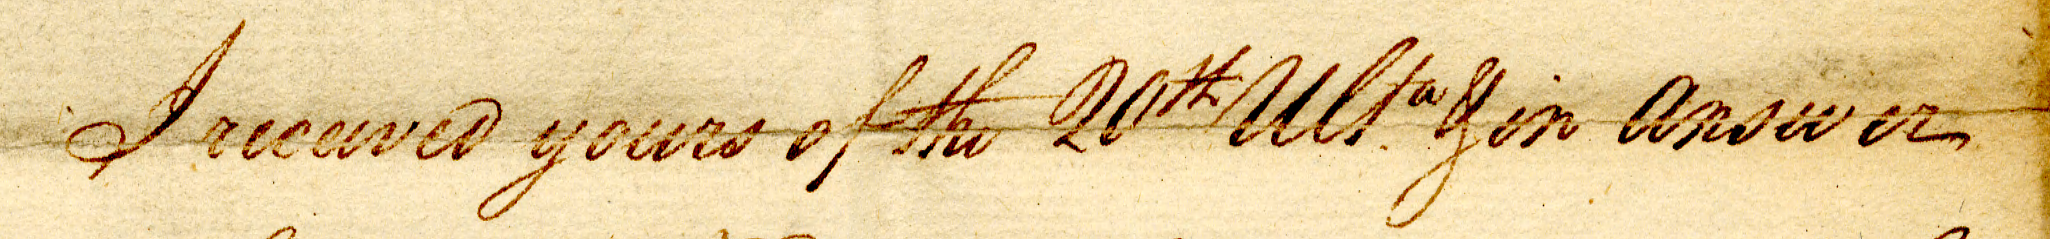I received yours of the 20^th Ult^o. & in answer
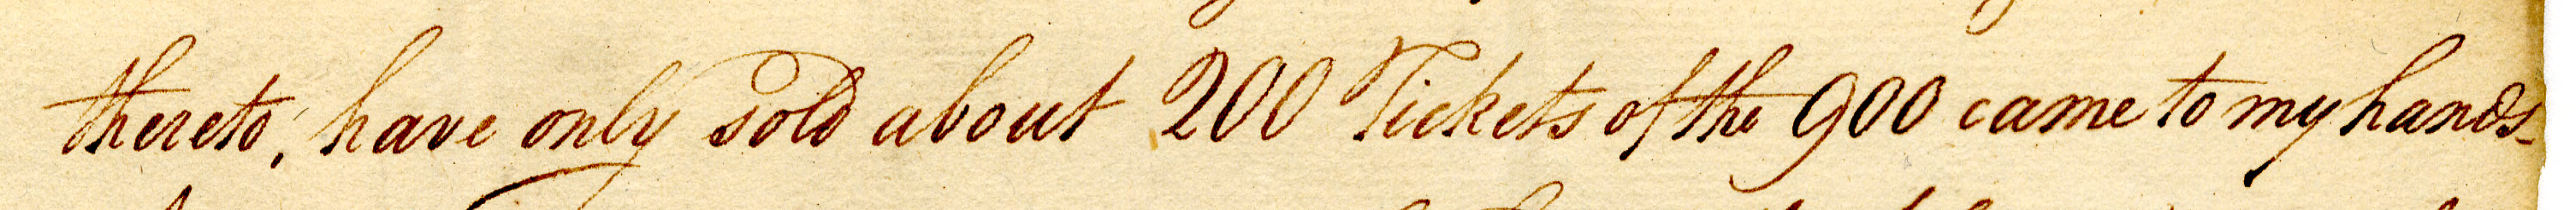thereto, have only sold about 200 Tickets of the 900 came to my hands.
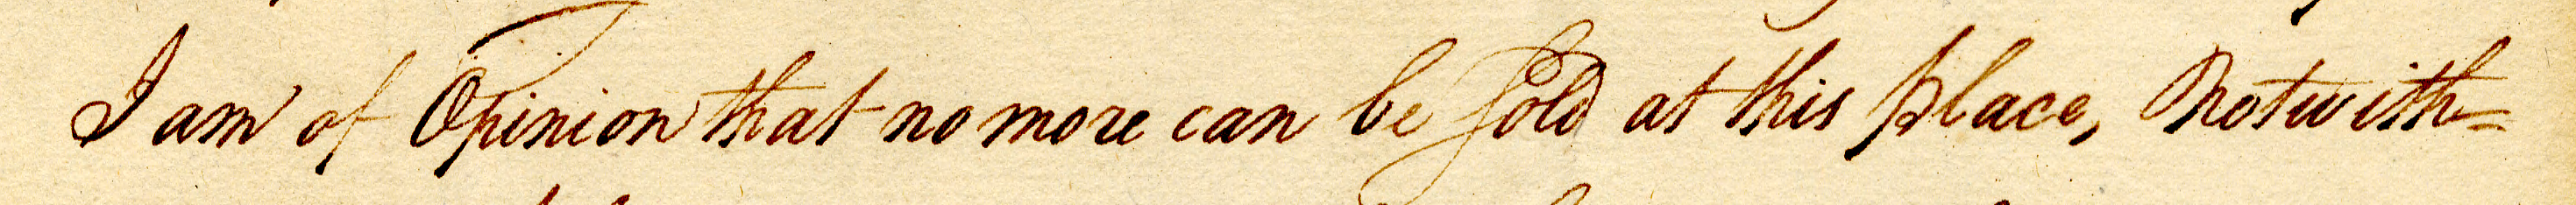I am of opinion that no more can be sold at this place, notwith-
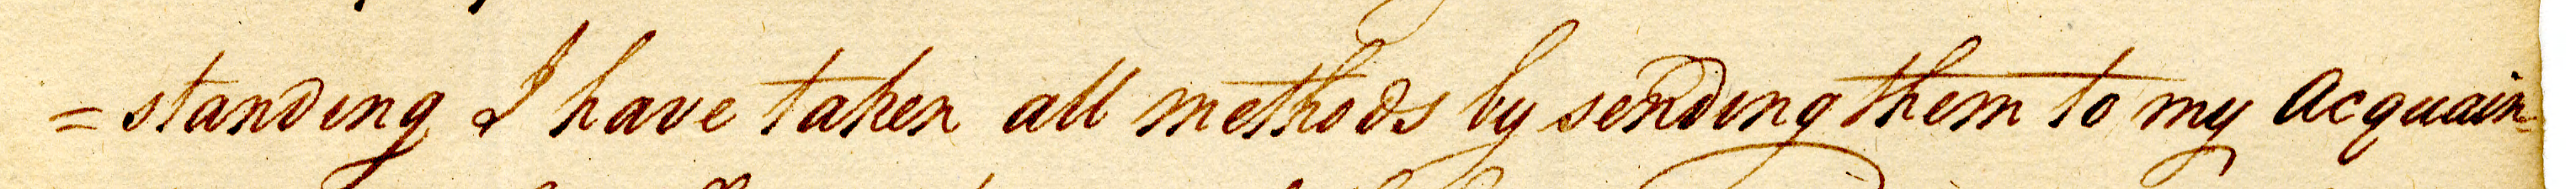-standing I have taken all methods by sending them to my acquain-
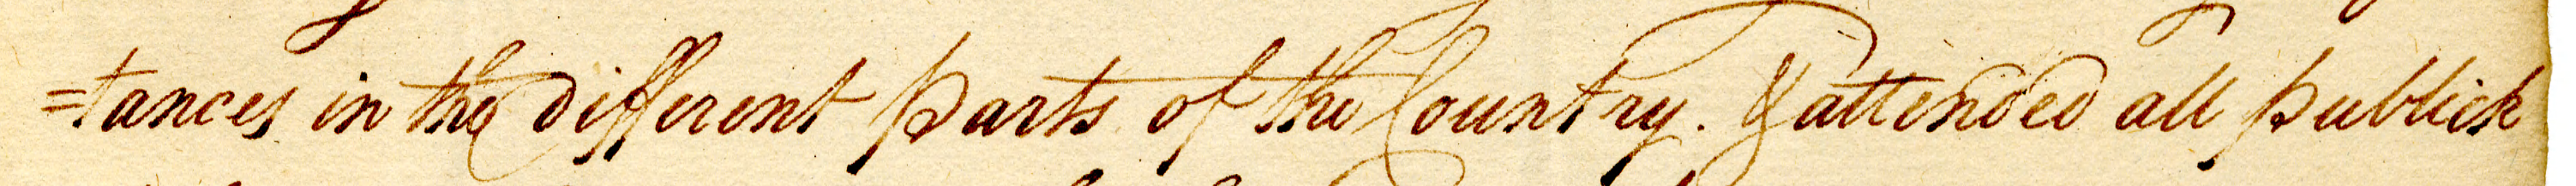-tances in the different parts of the Country. & attended all publick
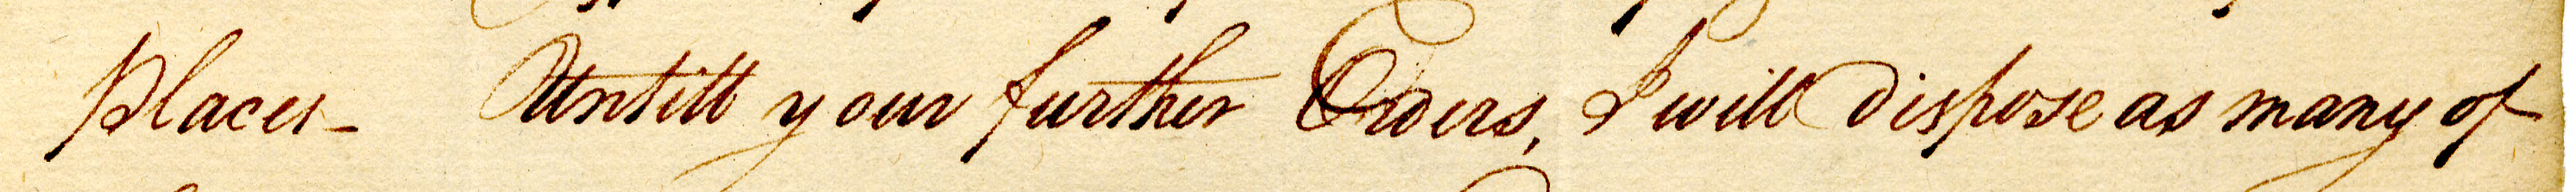places. Untill your further Orders, I will dispose as many of
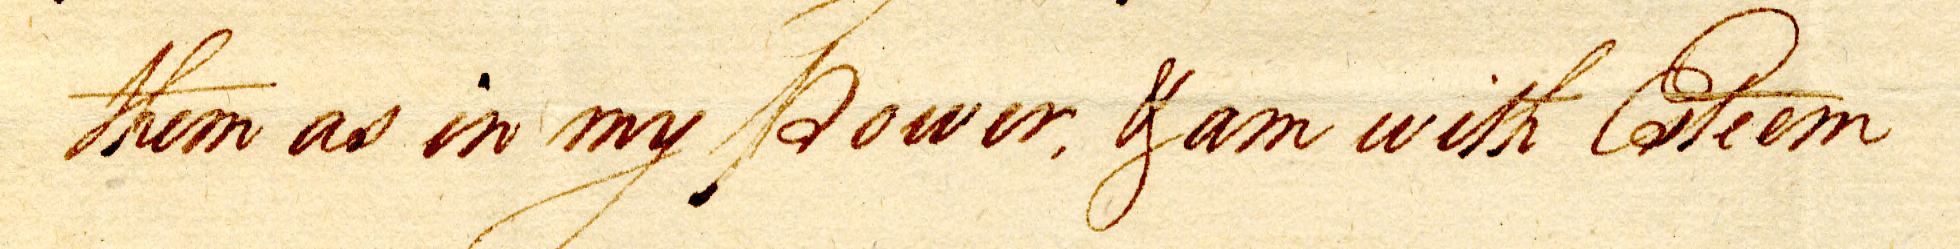them as in my power, & am with Esteem
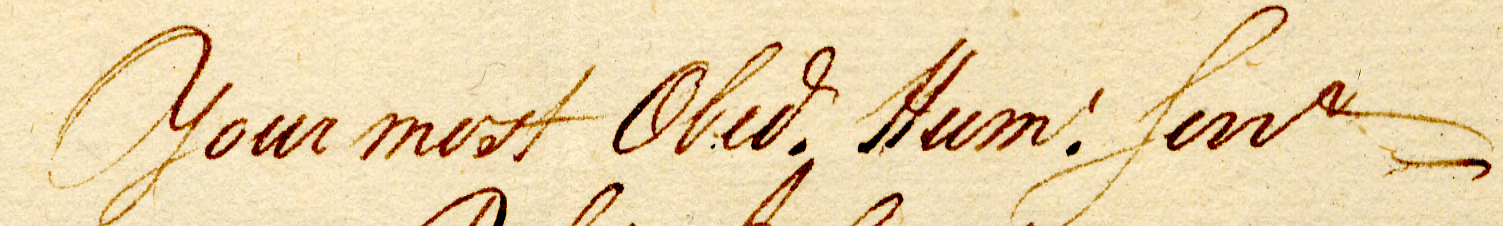Your most Obed. Hum^l. Serv^t
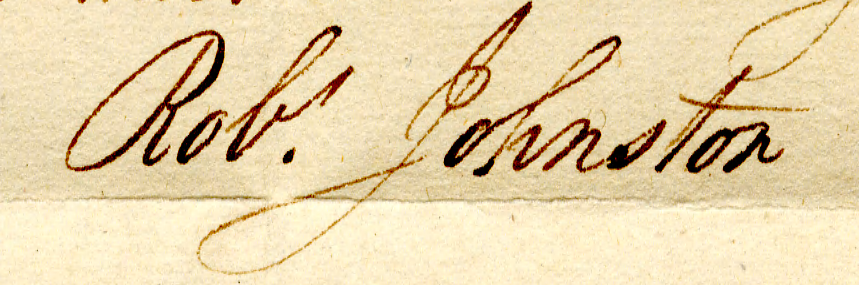Rob^t. Johnston
